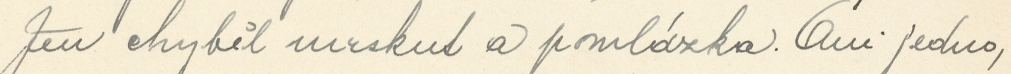Jen chyběl mrskut a pomlázka. Ani jedno,
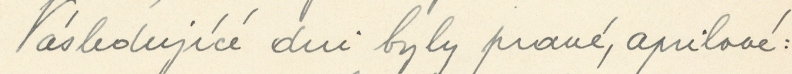Následující dni byly pravé, aprilové:
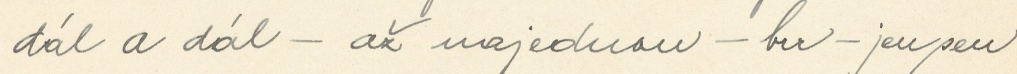dál a dál - až najednou - ber - jen sen
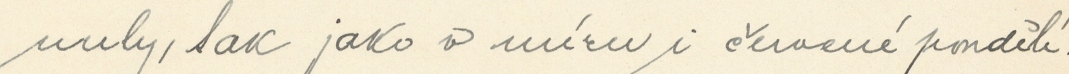nuly, tak jako v míru i červené pondělí.
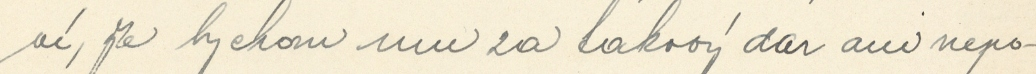ví, že bychom mu za takový dar ani nepo-
